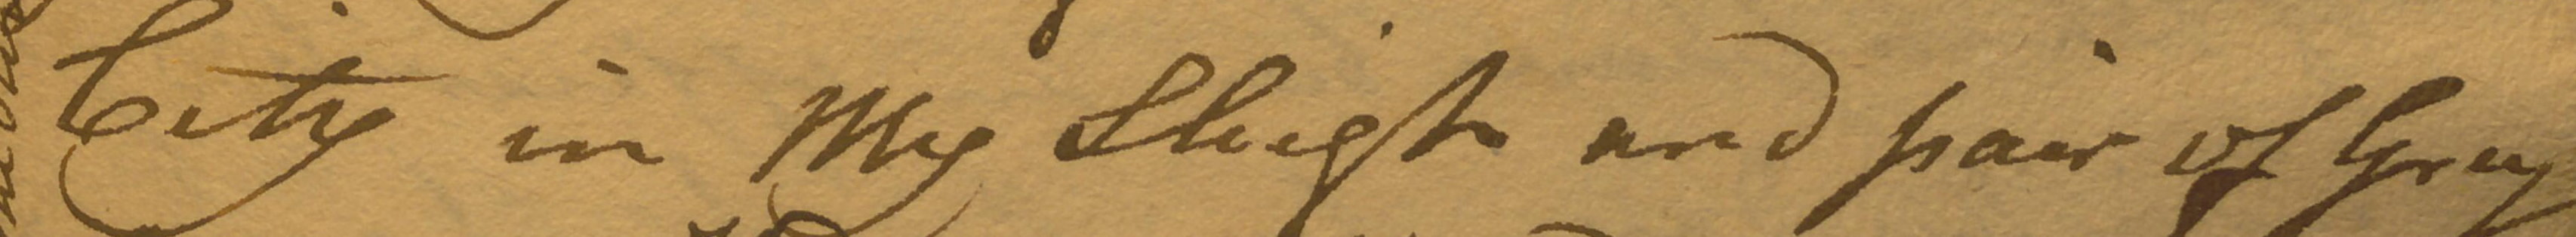City in My Sleigh and pair of Grey
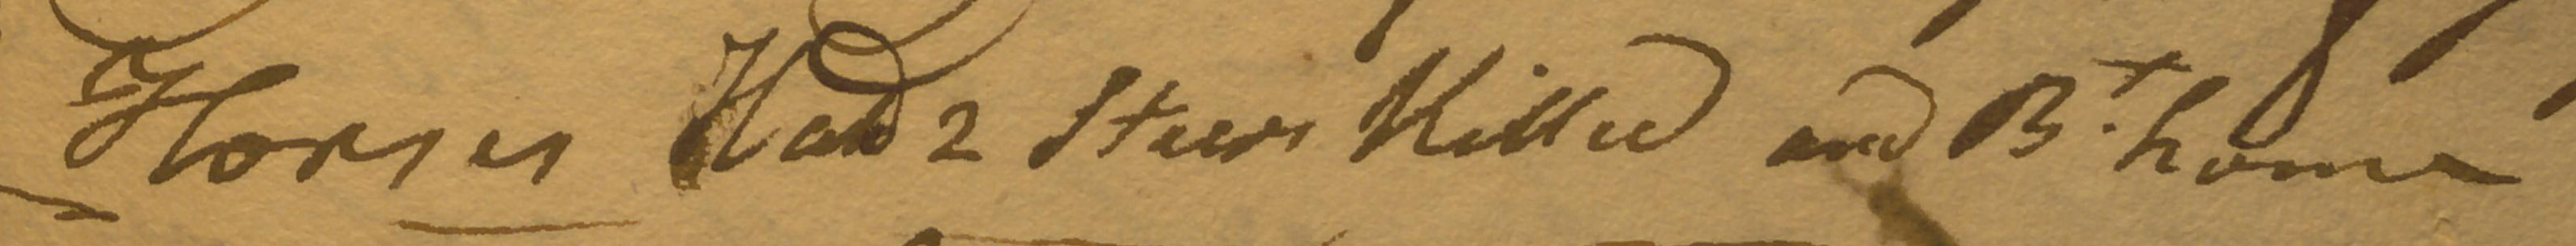Horses Had 2 steers Killed and B^t. home
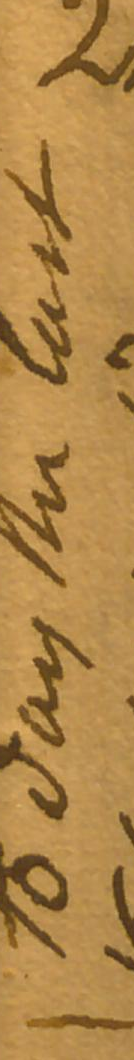today the last
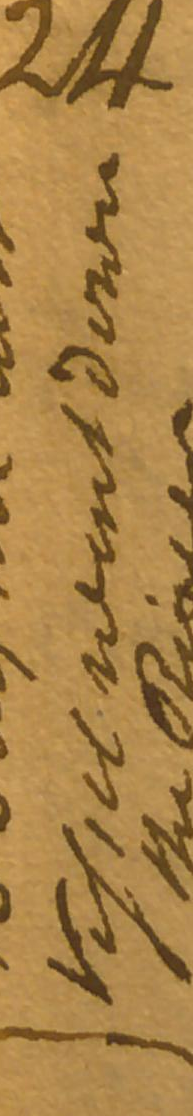Vessel went down
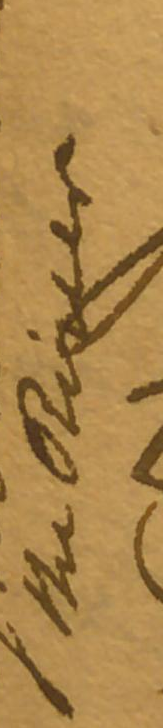the River
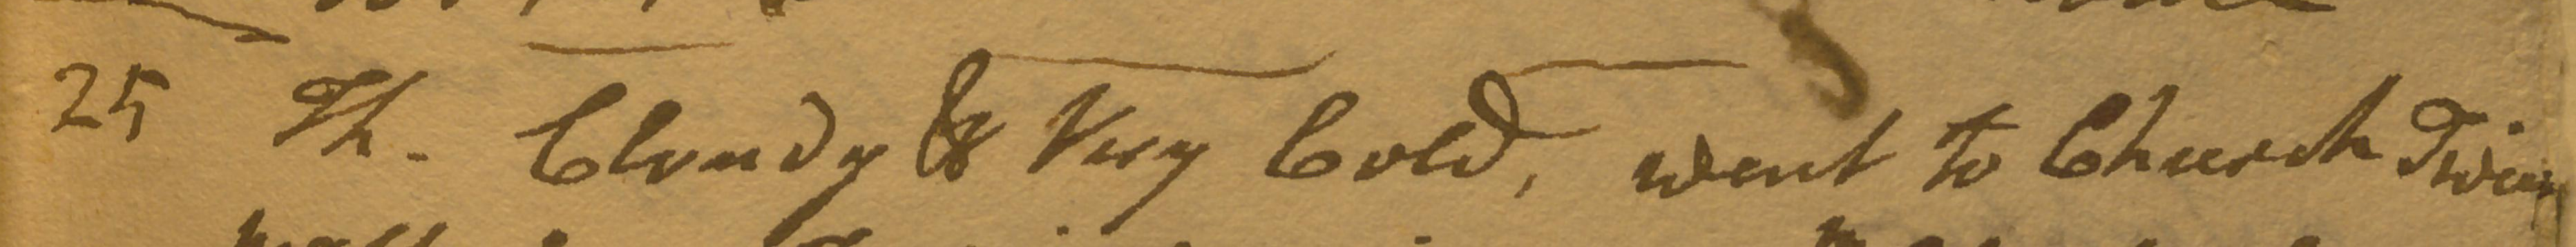25 Th. Cloudy & Very Cold, went to Church Twice
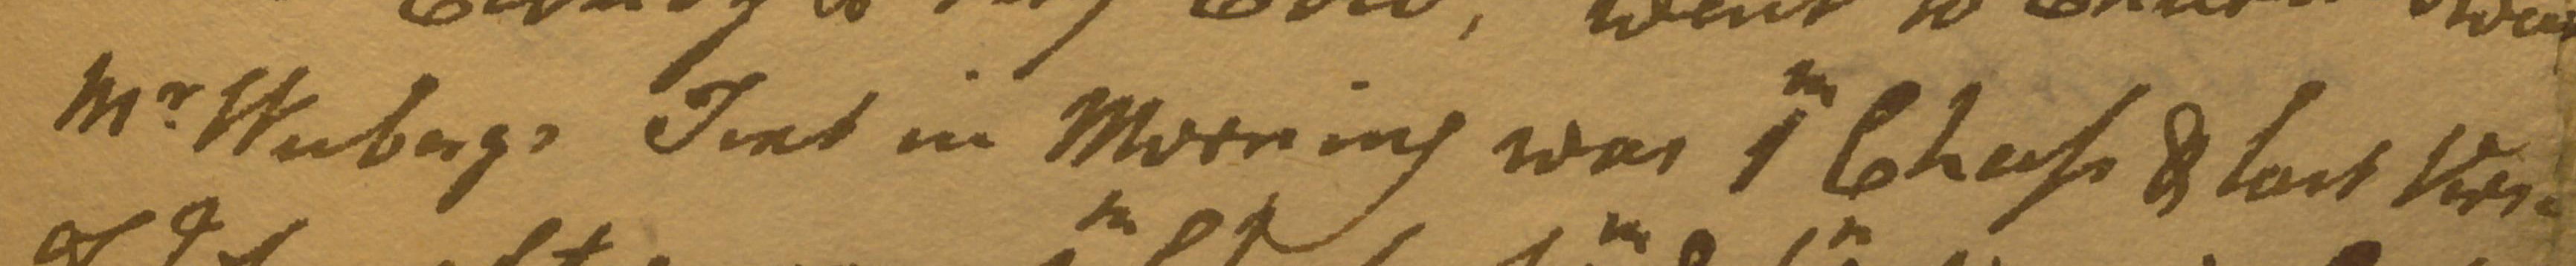M^r. Weibergs Text in Morning was 1^th Chap & last Verse
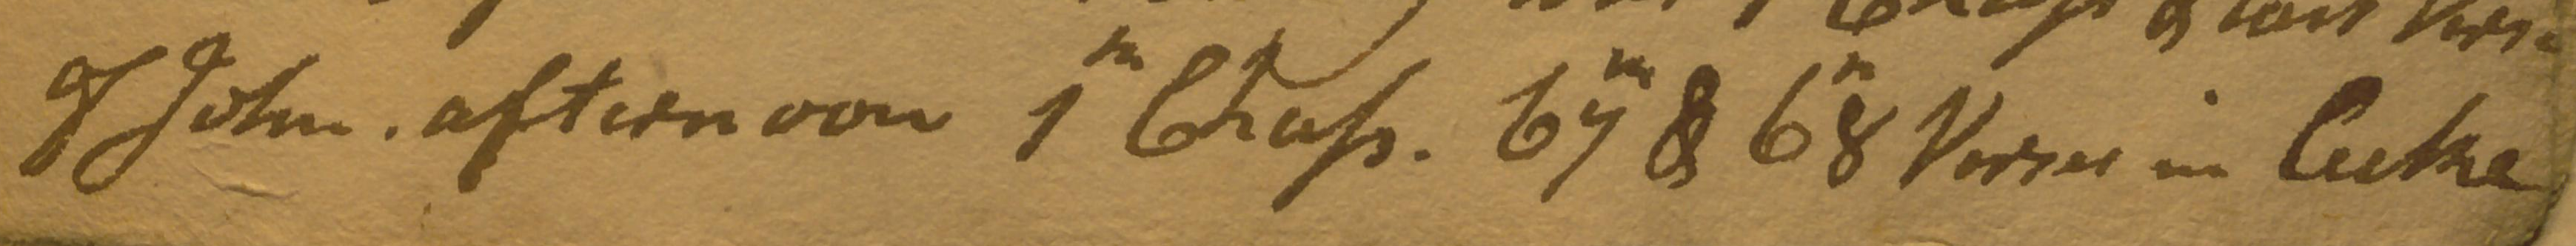of John afternoon 1^th Chap. 67^th & 68^th Verses in luke
